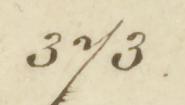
373
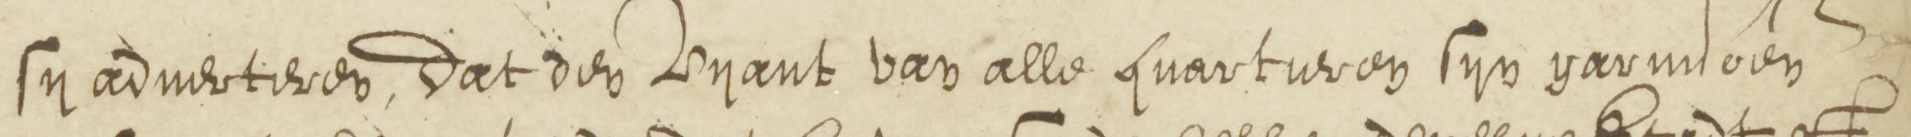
sy aduerteren, dat den Vyant van alle quartieren syn garnisoen
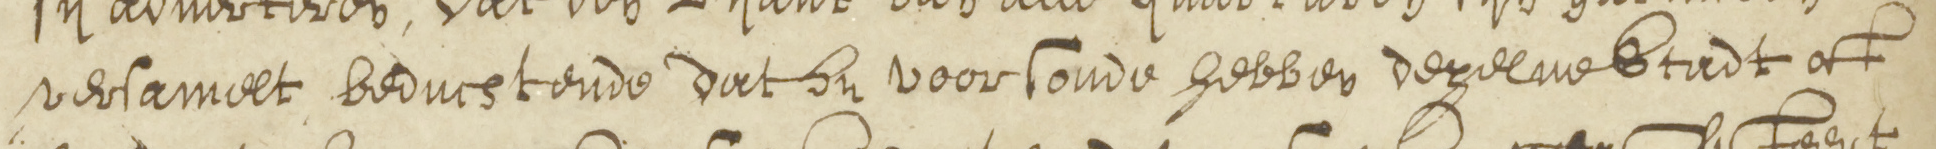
versamelt beduchtende dat hy voor soude hebben dezelue Stadt off
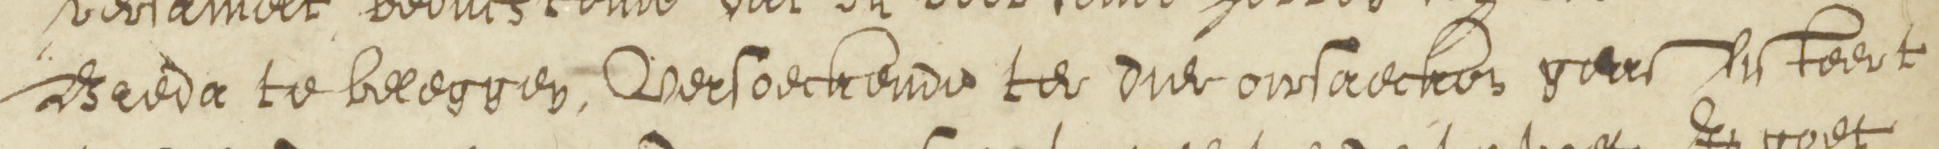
Breda te beleggen, Versoeckende ter dier oirsaecken geassisteert
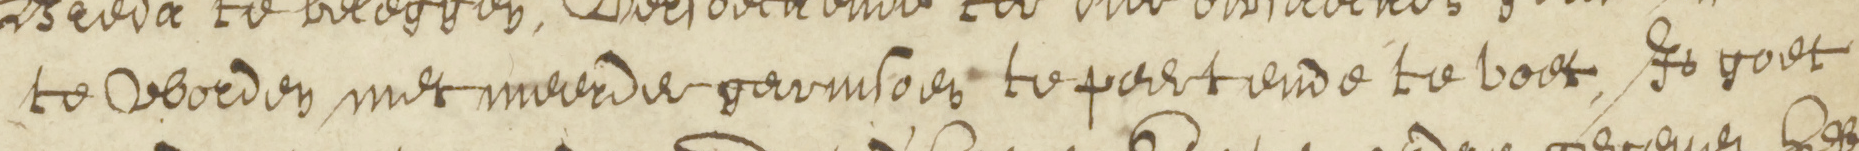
te worden met meerder garnisoen te peert ende te voet. Is goet
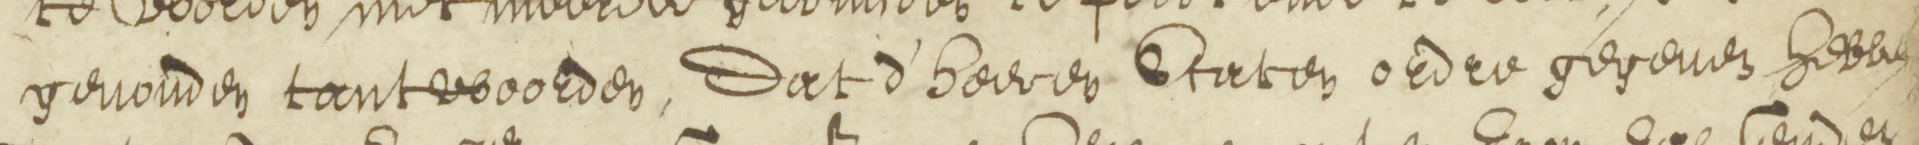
geuonden tantwoorden, Dat d'heeren Staten ordre gegeuen hebben
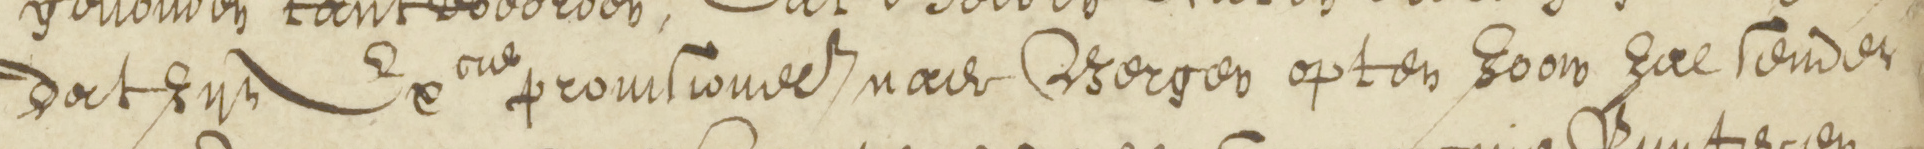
dat zyn Excie prouisionel naer Bergen opten zoom zal senden
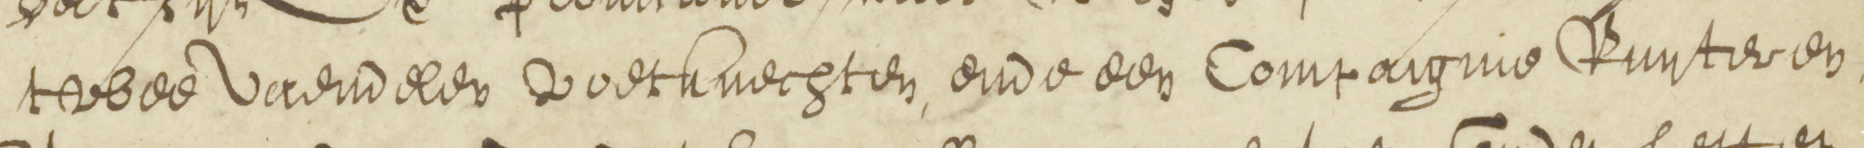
twee vaendelen voetknechten, ende een Compaignie Ruyteren,
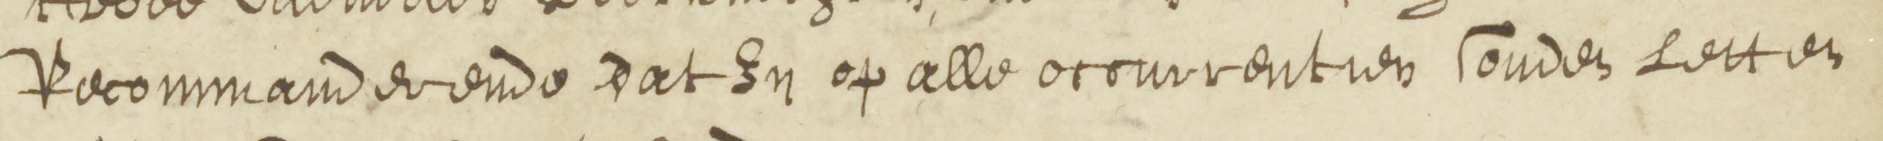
Recommanderende dat zy op alle occurrentien souden letten
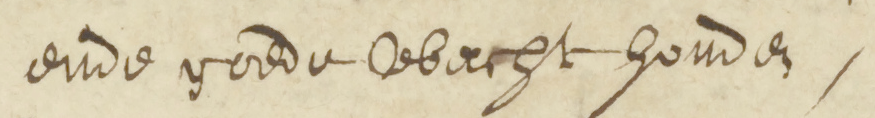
ende goede wacht houden.
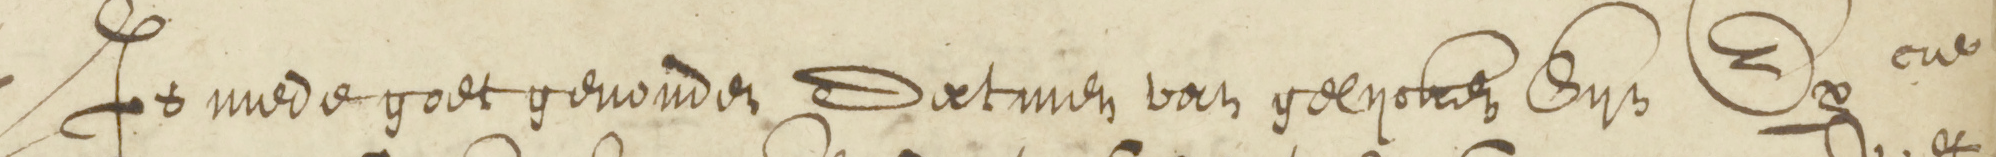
Is mede goetgeuonden datmen van gelycken Syn Excie
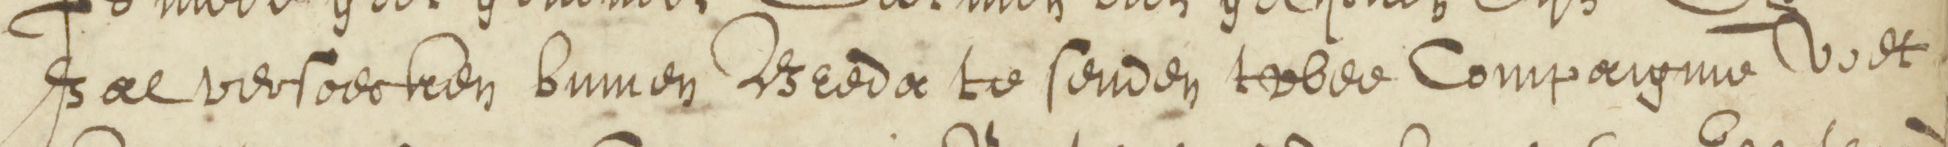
zal versoecken binnen Breda te senden twee Compaignie voet
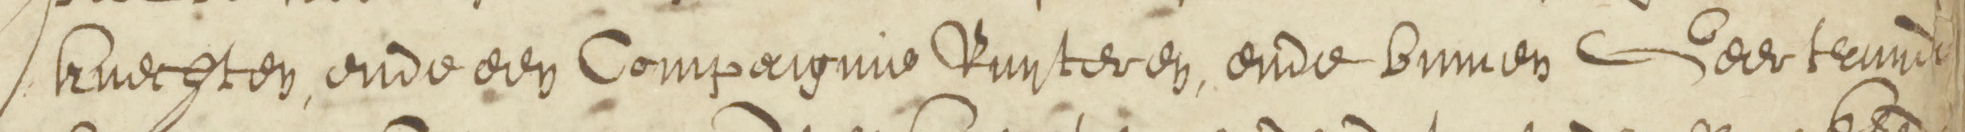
knechten ende een Compaignie Ruyteren, ende binnen Geertruyd
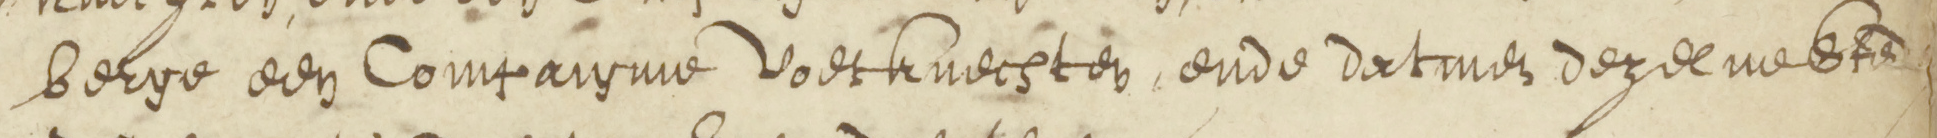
berge een Compaignie voetknechten, ende datmen dezelue Stad
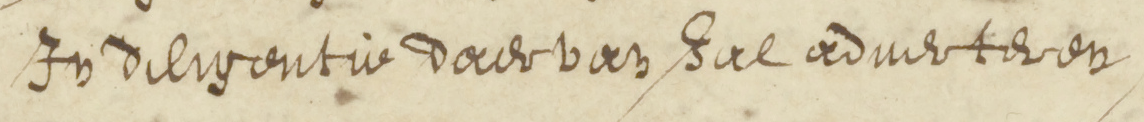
In diligentie daervan zal aduerteren.
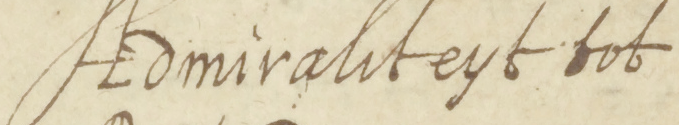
Admiraliteyt tot
